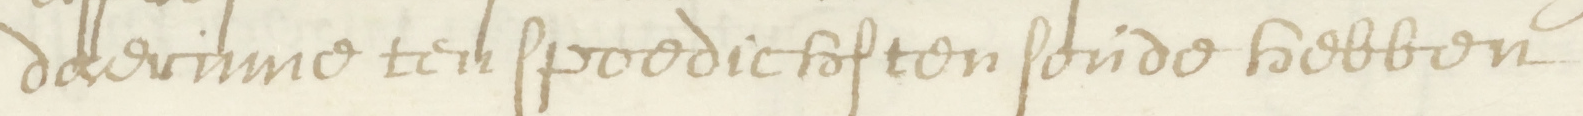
daerinne ten spoedichsten soude hebben
